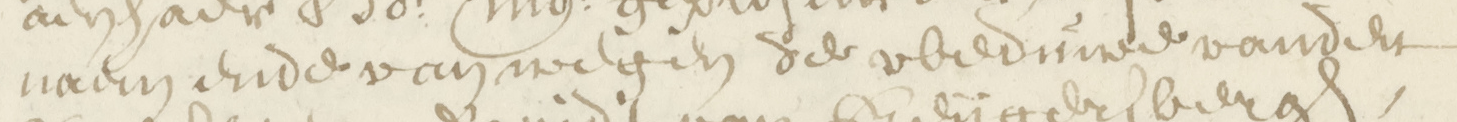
naem ende van wegen de weduwe vanden
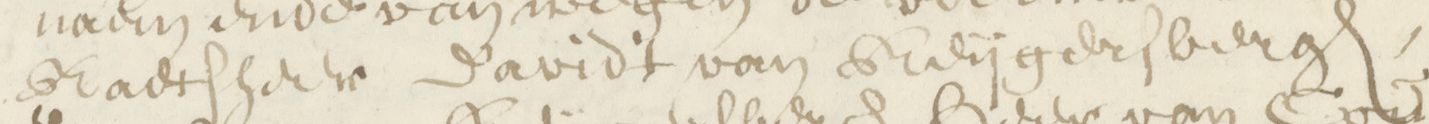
Raetsheer Davidt van Reijgersbergh,
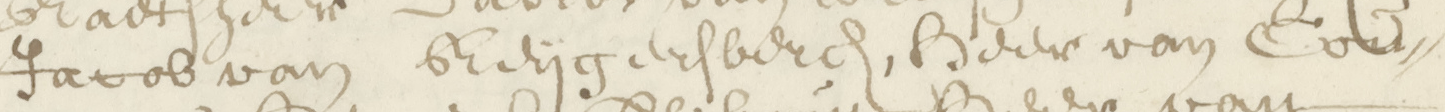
Jacob van Reijgersberch, Heer van Cou„
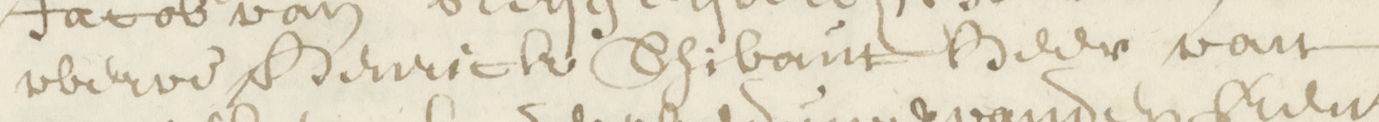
werve, Henrick Thibaut Heer van
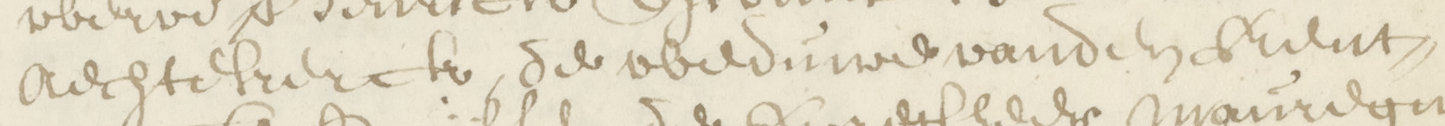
Aechtekerck, de weduwe vanden Rent„
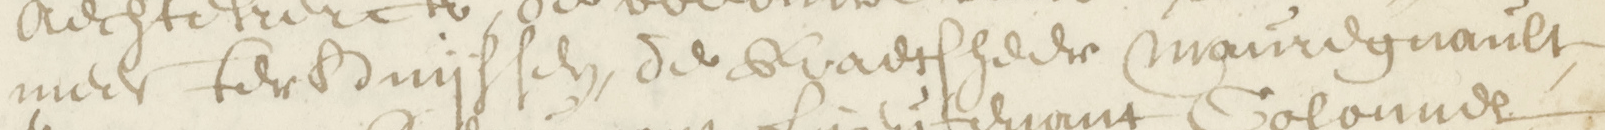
meester Huijssen, de Raetsheer Mauregnault,
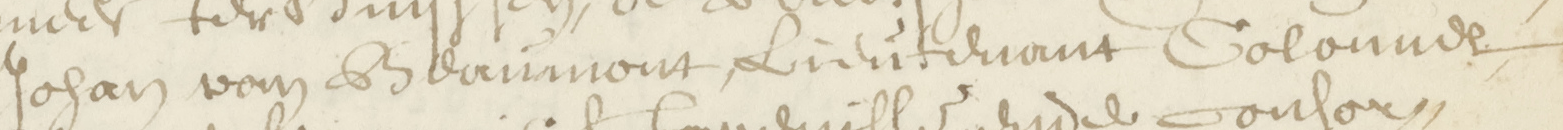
Johan van Beaumont, Lieutenant Colonnel,
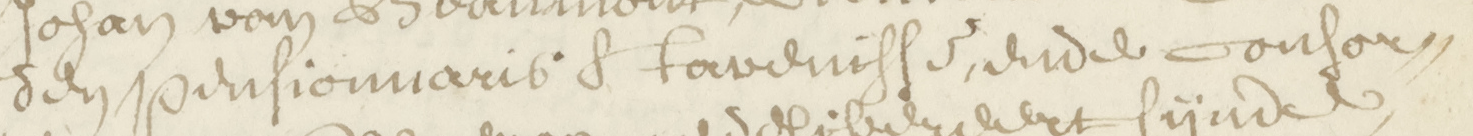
den Pensionnaris Stavenisse, ende consor„
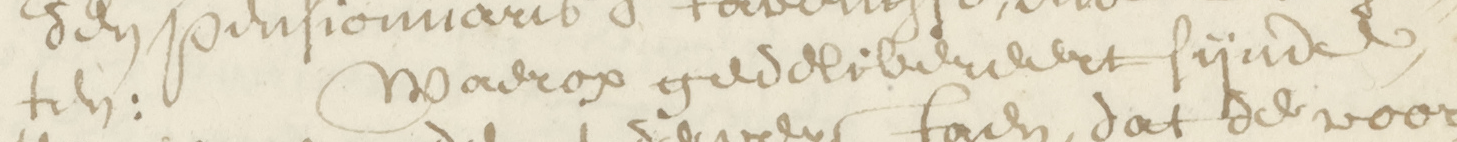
ten: Waerop gedelibereert sijnde,
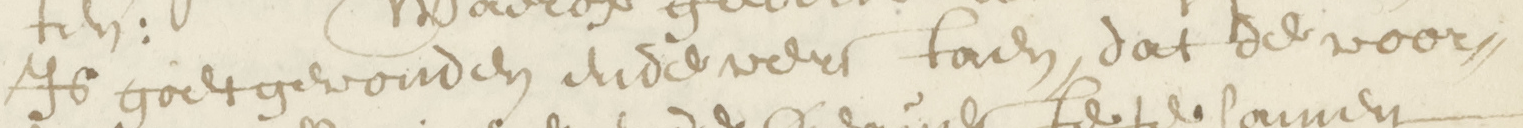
Is goetgevonden ende verstaen, dat de voor„
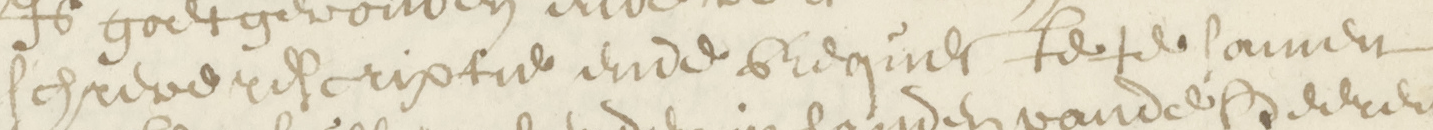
schreve rescriptie ende Requeste te samen
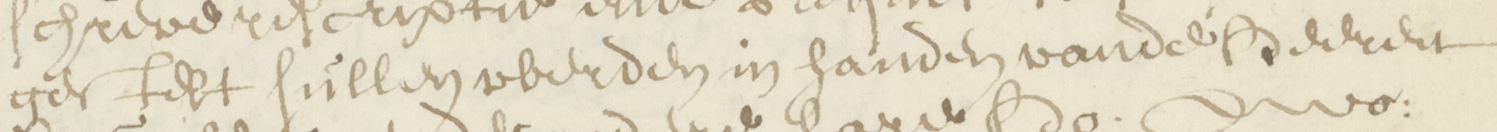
gestelt sullen werden in handen vande Heeren
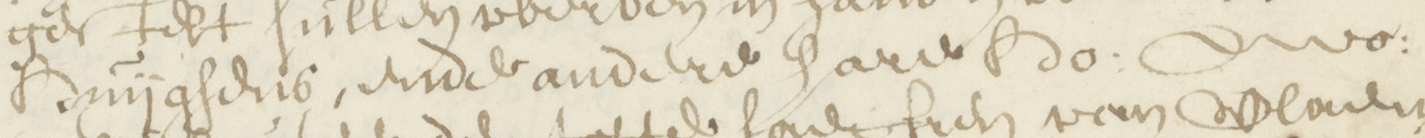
Huijghens, ende andere hare Ho:Mo:
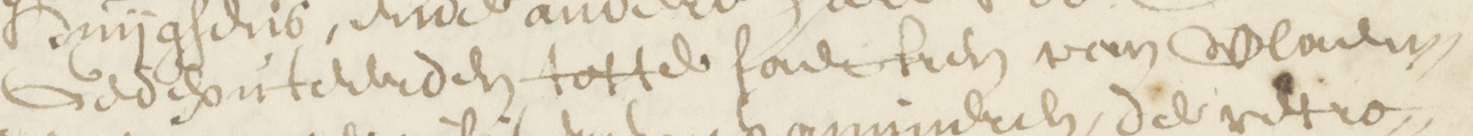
Gedeputeerden totte saecken van Vlaen„
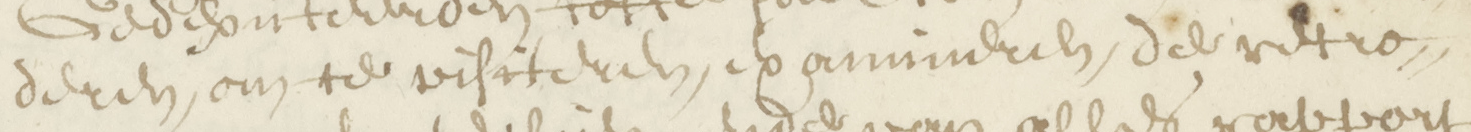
deren, om te visiteren, examineren, de retro„
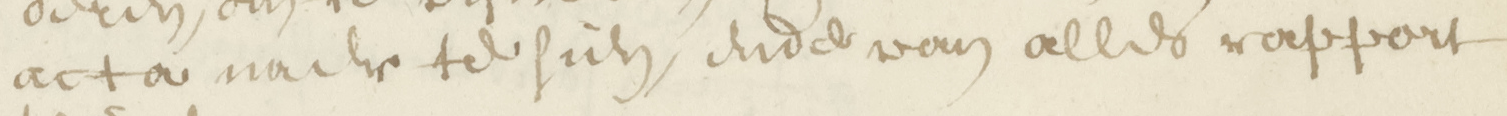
acta naer te sien, ende van alles rapport
